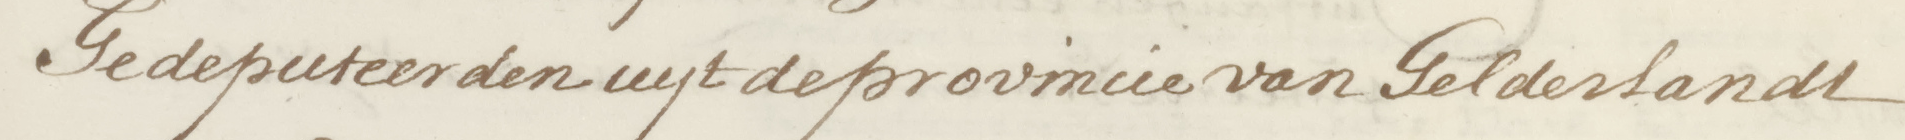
Gedeputeerden uyt de provincie van Gelderlandt
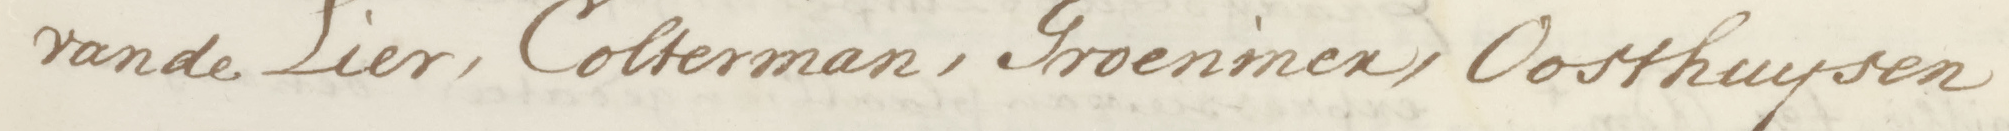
van de Lier, Colterman, Groenincx, Oosthuysen
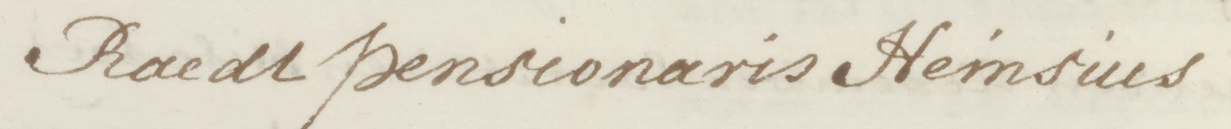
Raedt pensionaris Heinsius
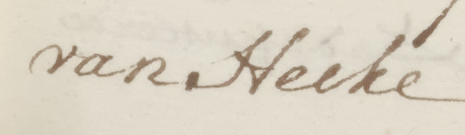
van Hecke
